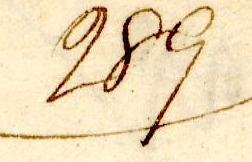289
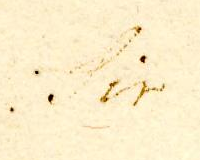Sir
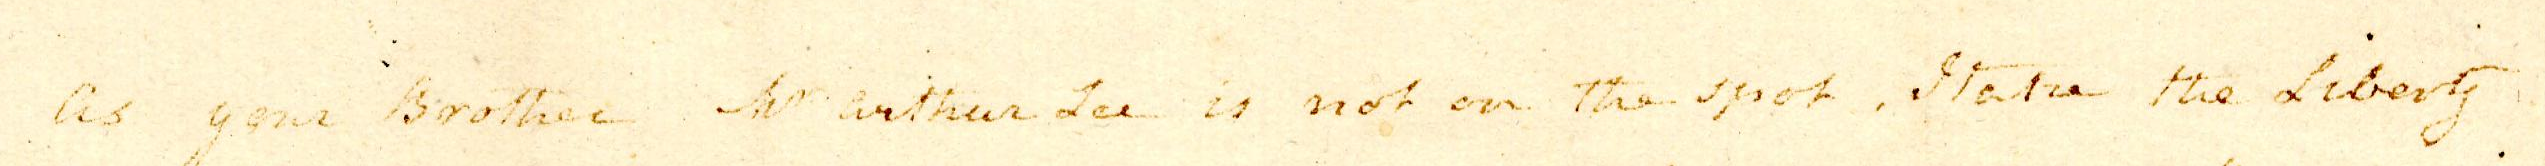As your Brother M^r Arthur Lee is not on the spot. I take the Liberty
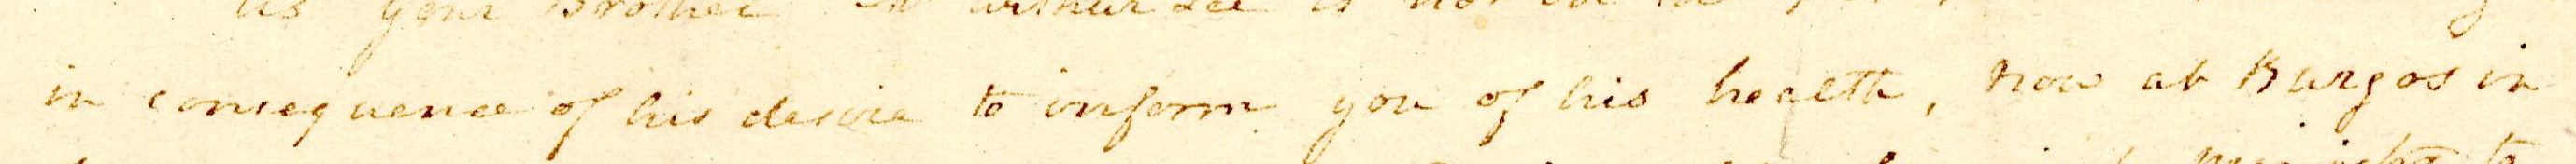in consequence of his desire to inform you of his health, now at Burgos in
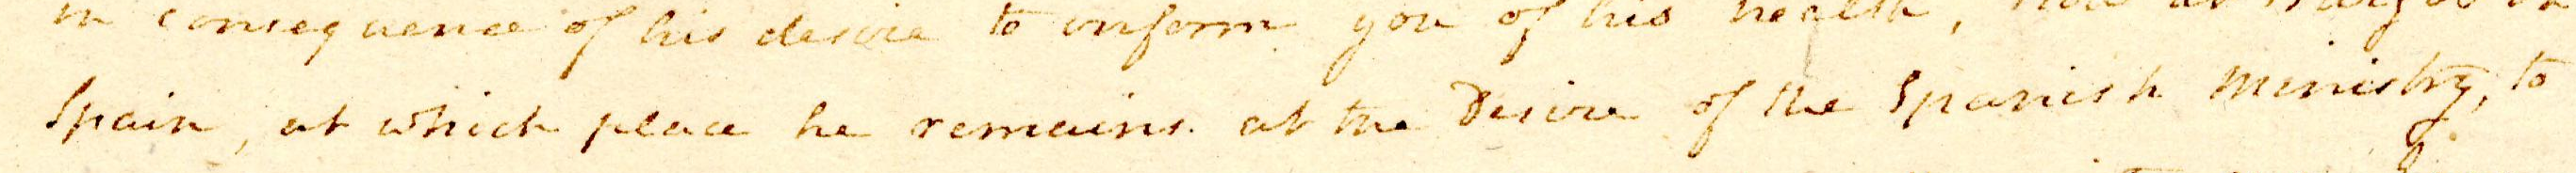Spain, at which place he remains at the desire of the Spanish ministry, to
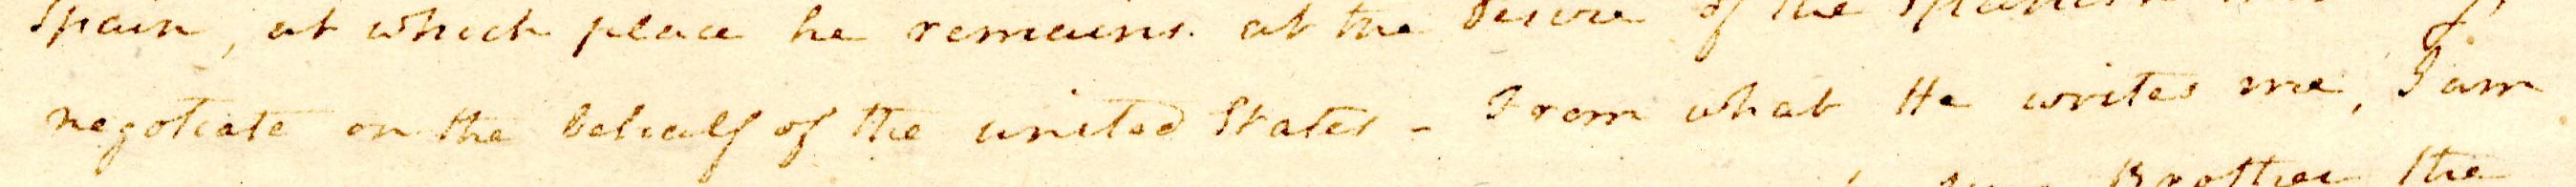negotiate on the behalf of the United States- From what he writes me, I am
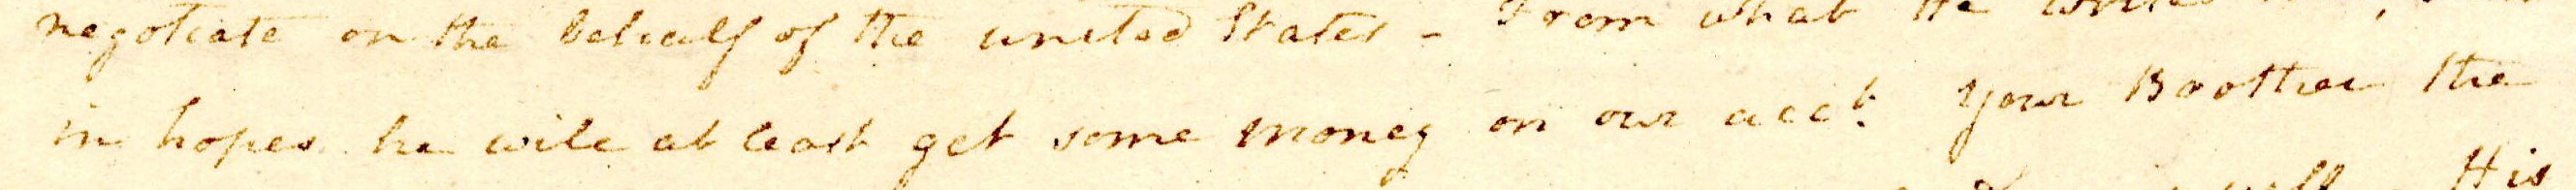in hopes he will at least get some money on our acc^t your Brother the
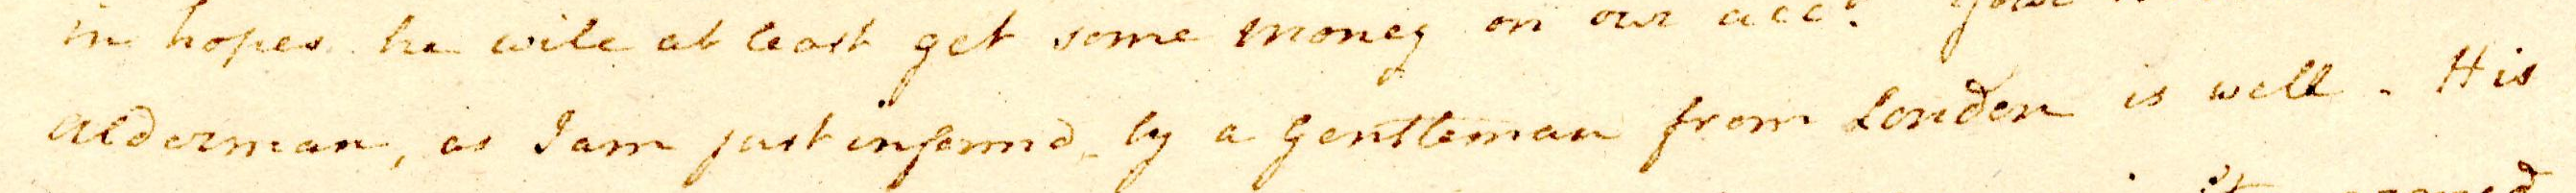Alderman, as I am just informd, by a Gentleman from London is well. His
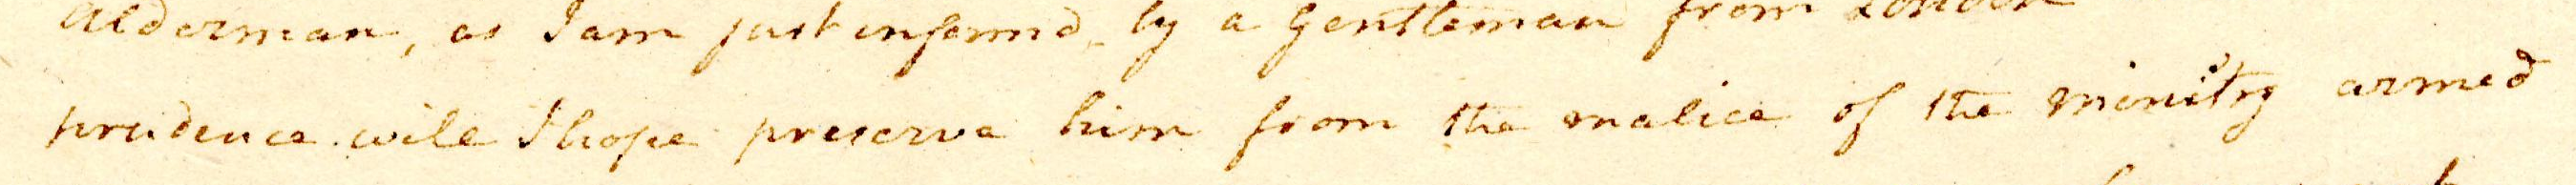prudence will I hope preserve him from the malice of the enmity armed
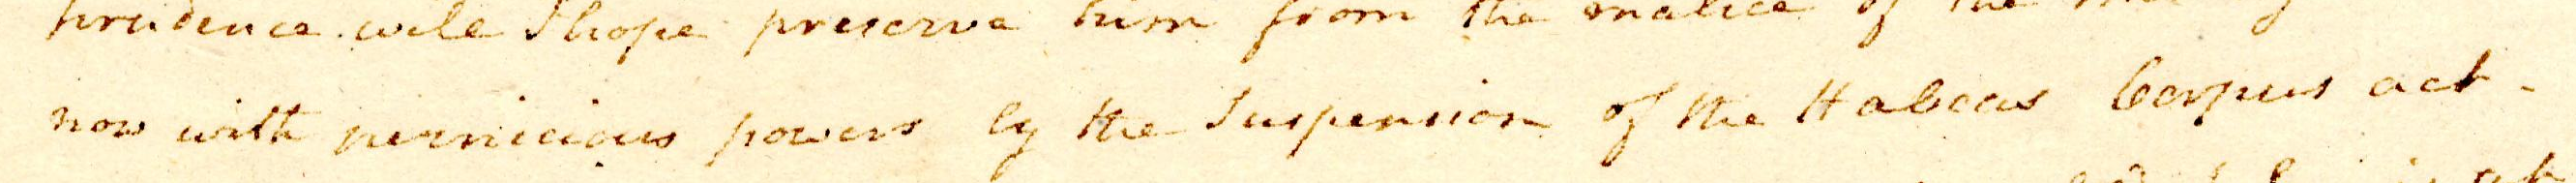now with pernicious powers by the Suspension of the Habeas Corpus act-
